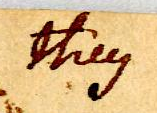they
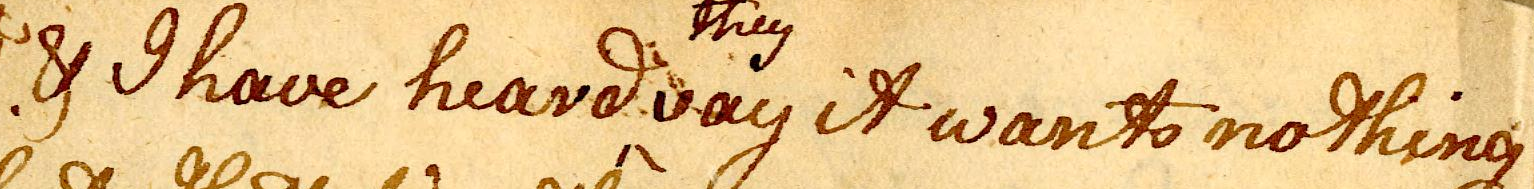& I have heard ^ say it wants nothing
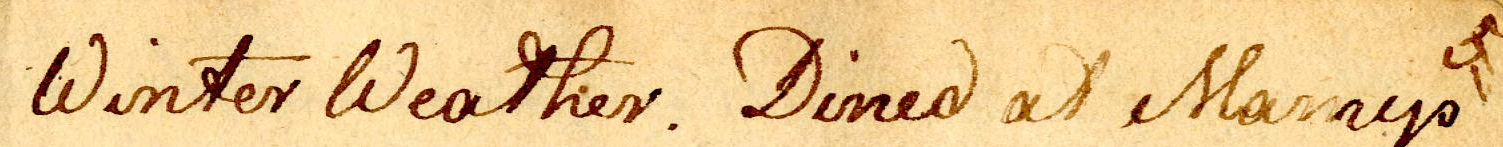Winter Weather. Dined at Mamys
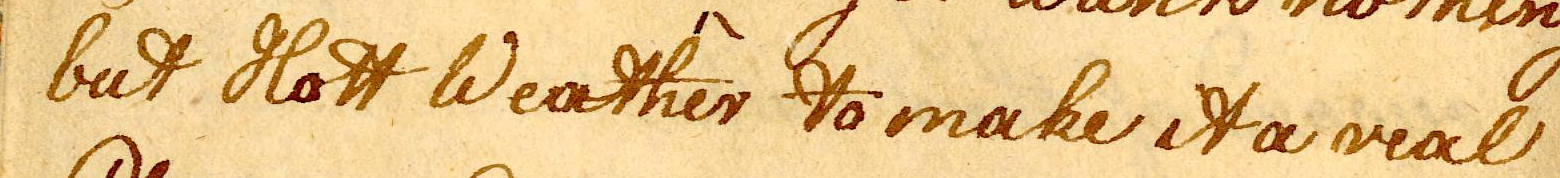but Hott Weather to make it a real
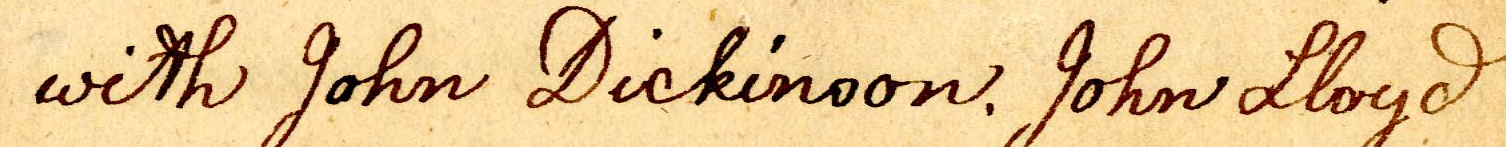with John Dickinson, John Lloyd
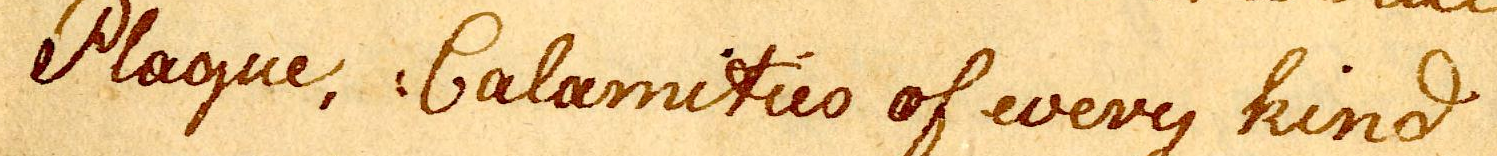Plague, Calamities of every kind
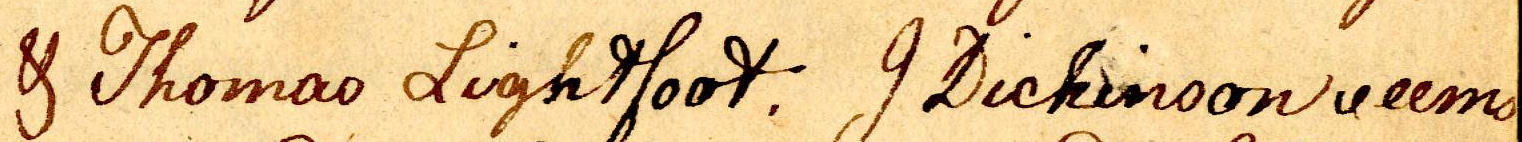& Thomas Lightfoot. J Dickinson seems
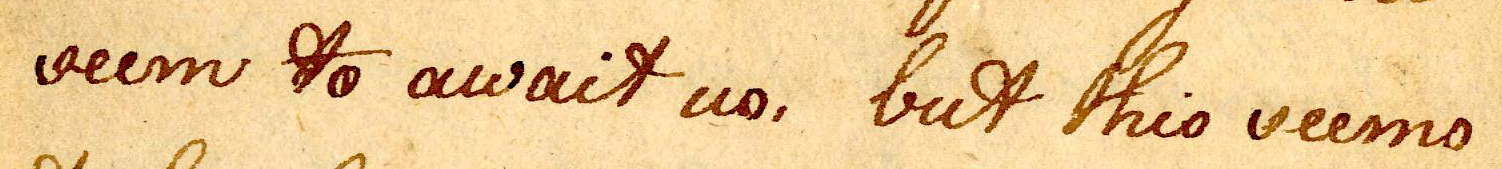seem to await us, but this seems
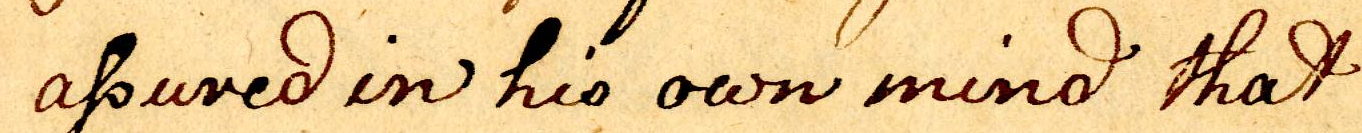assured in his own mind that
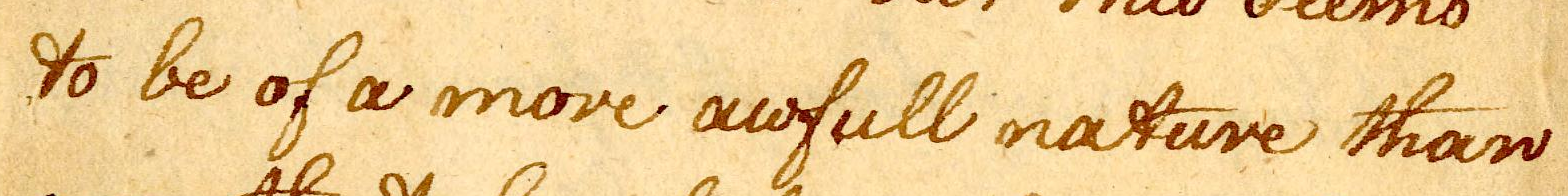to be of a more awfull nature than
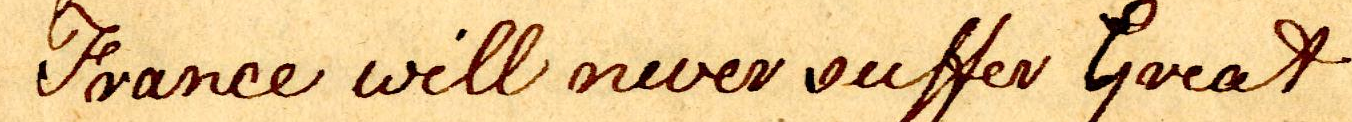France will never suffer Great
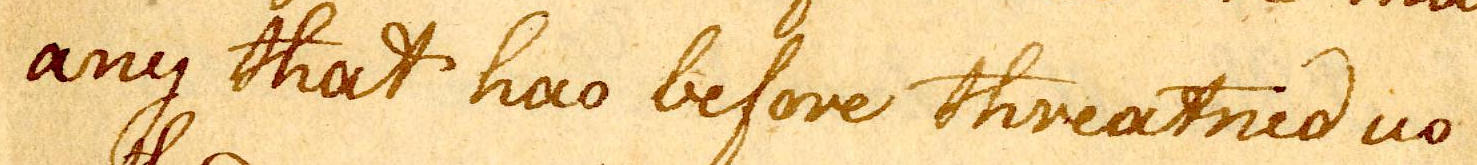any that has before threatned us
